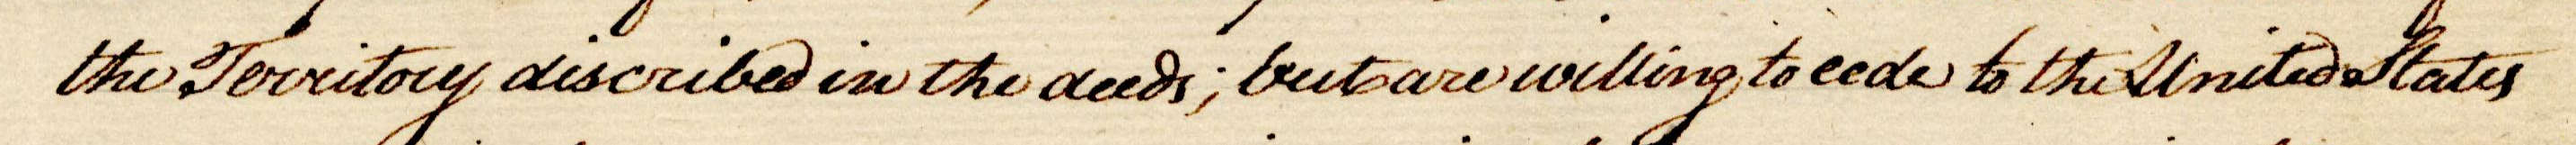the Territory described in the deeds; but are willing to cede to the United States
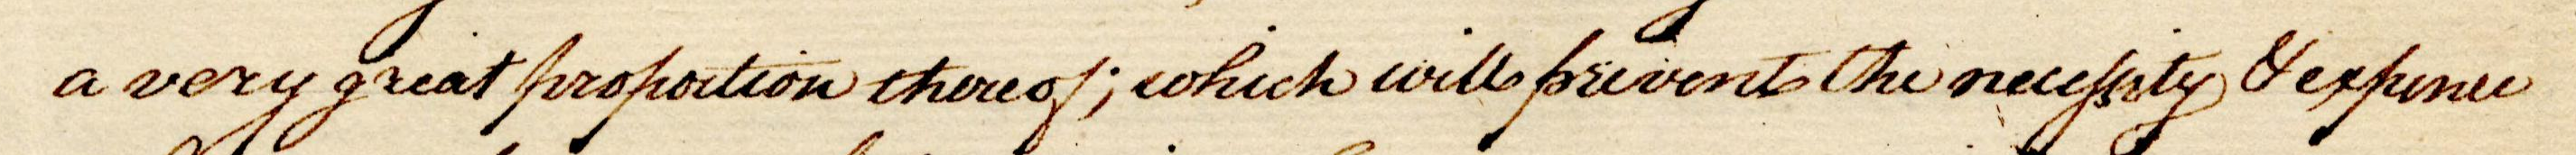a very great proportion thereof; which will prevent the necessity & expense
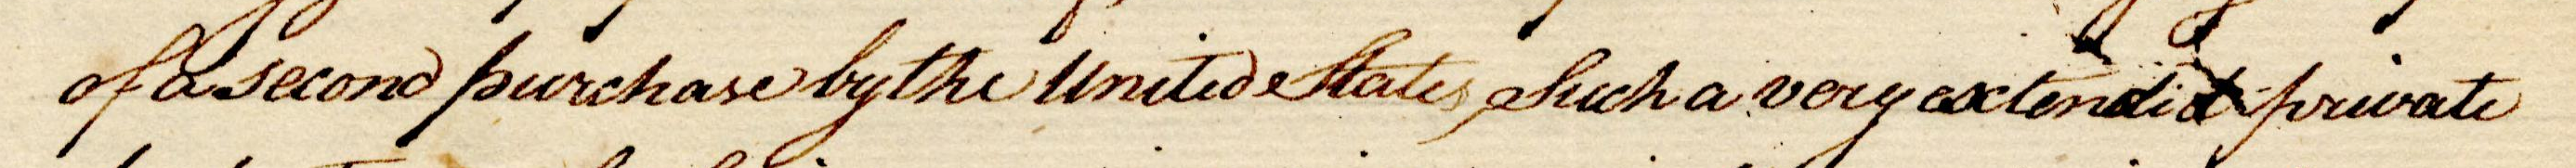of a second purchase by the United States, Such a very extend it private
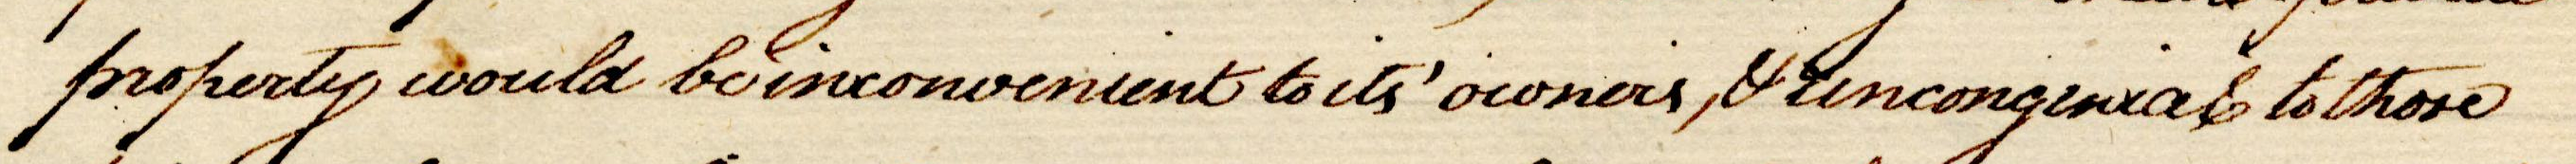property would be inconvenient to its' owners, & uncongenial to those
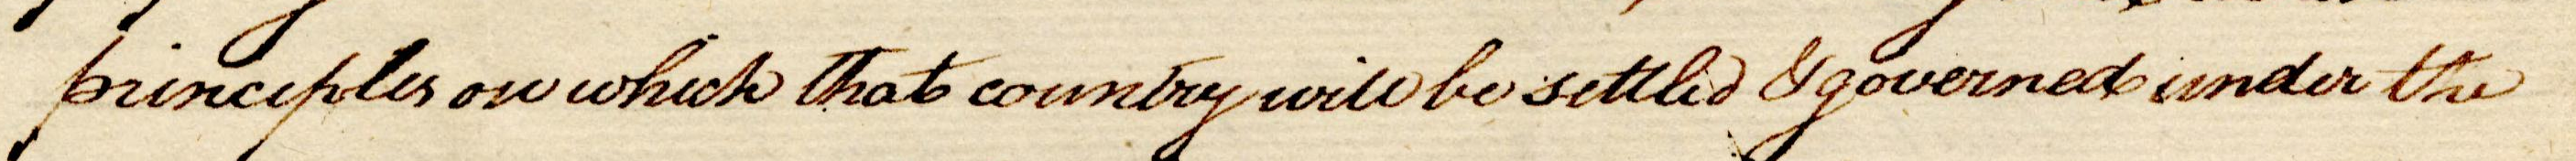principles on which that country will be settled & governed under the
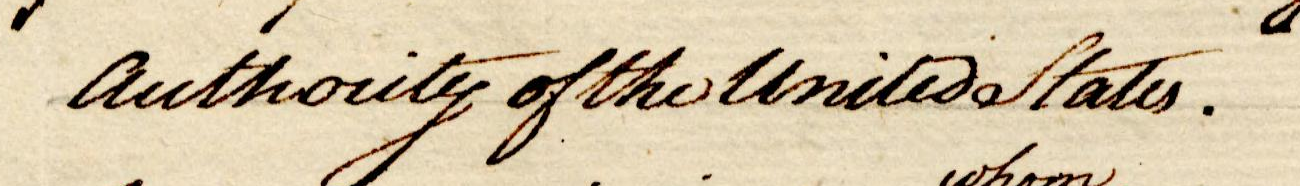Authority of the United States
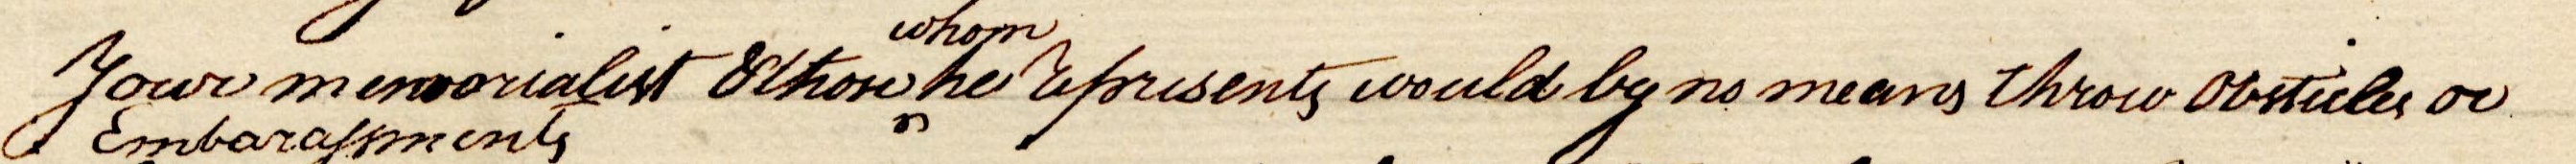Your memorialist & those ^ he represents would by no means throw articles or
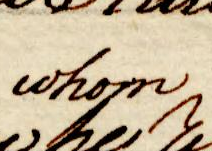whom
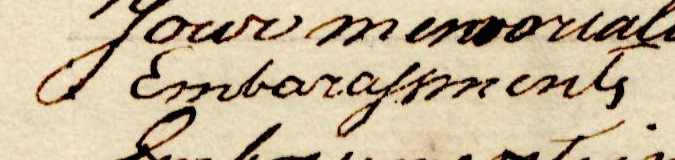Embarassments
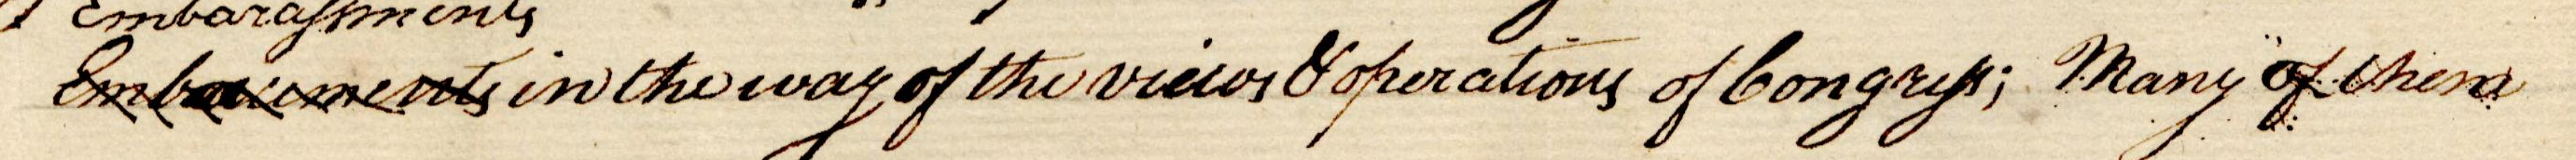[Embarassments] in the way of the views & operations of Congress; Many of them
